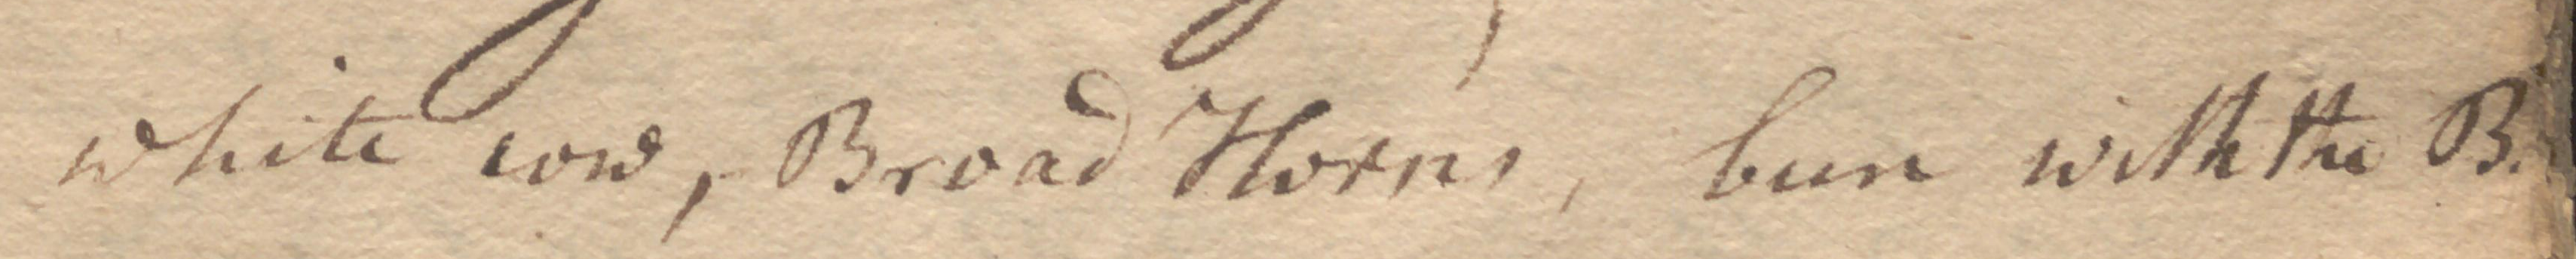white cow, Broad Horses, been with the B.
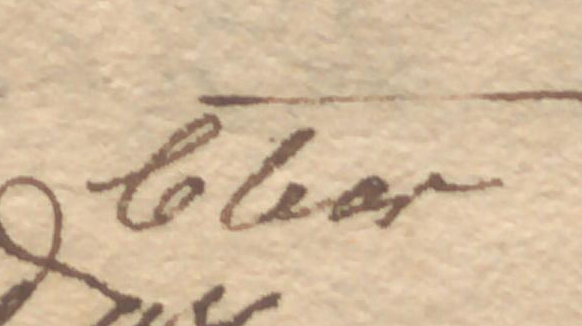Clear
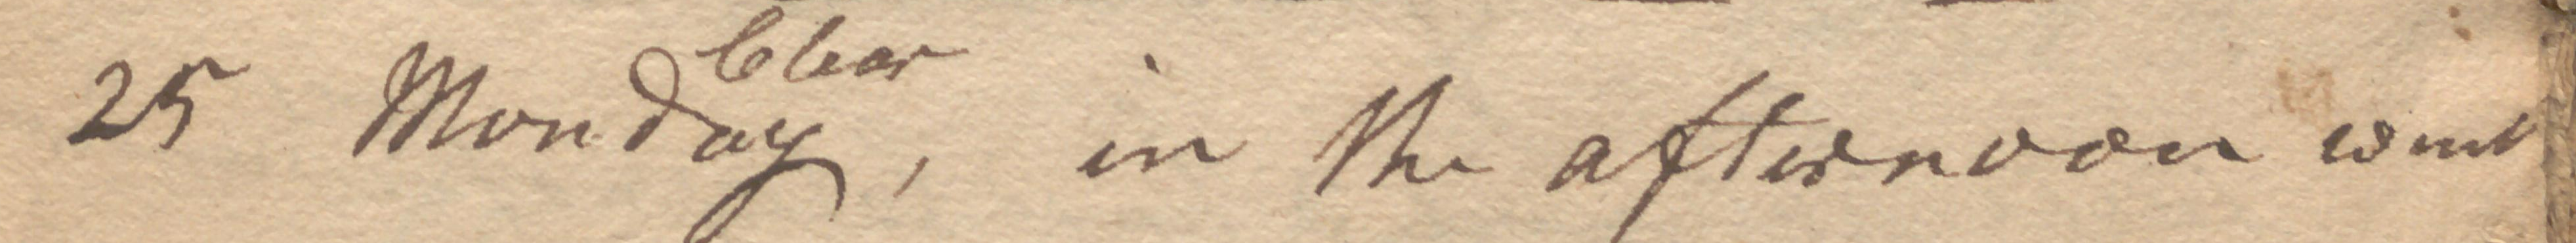25 Monday, in the afternoon went
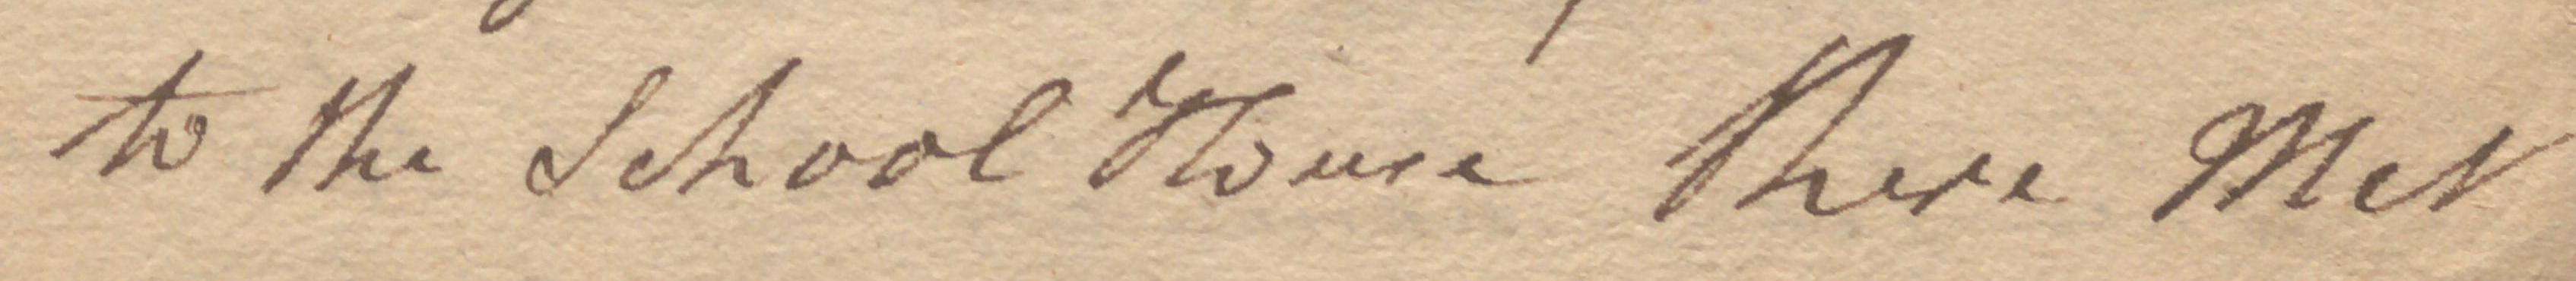to the School House there Met
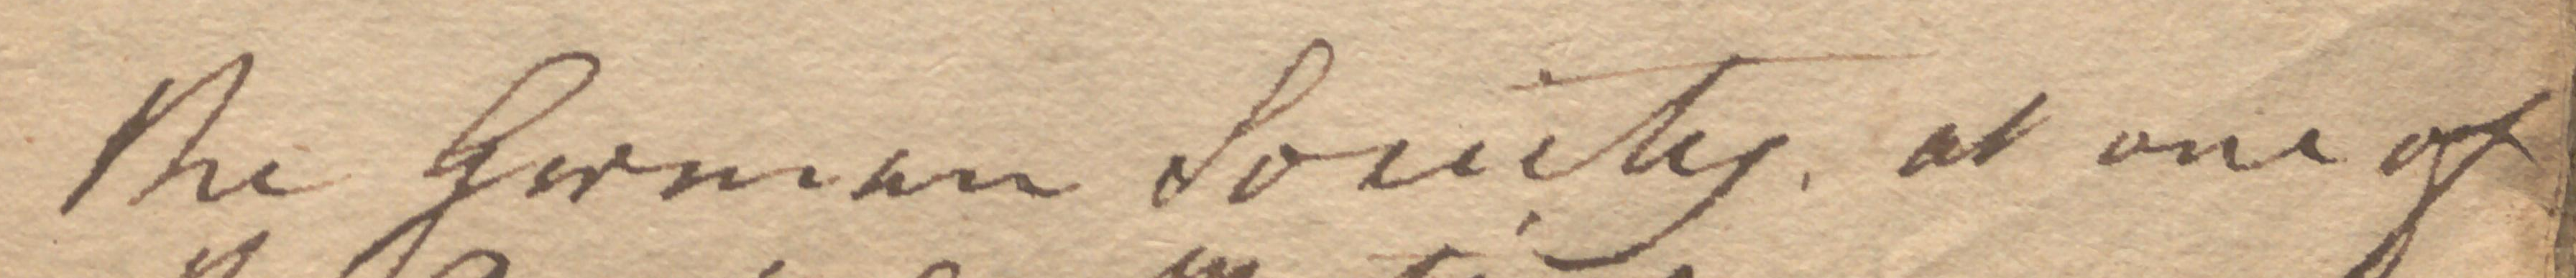the German Society at one of
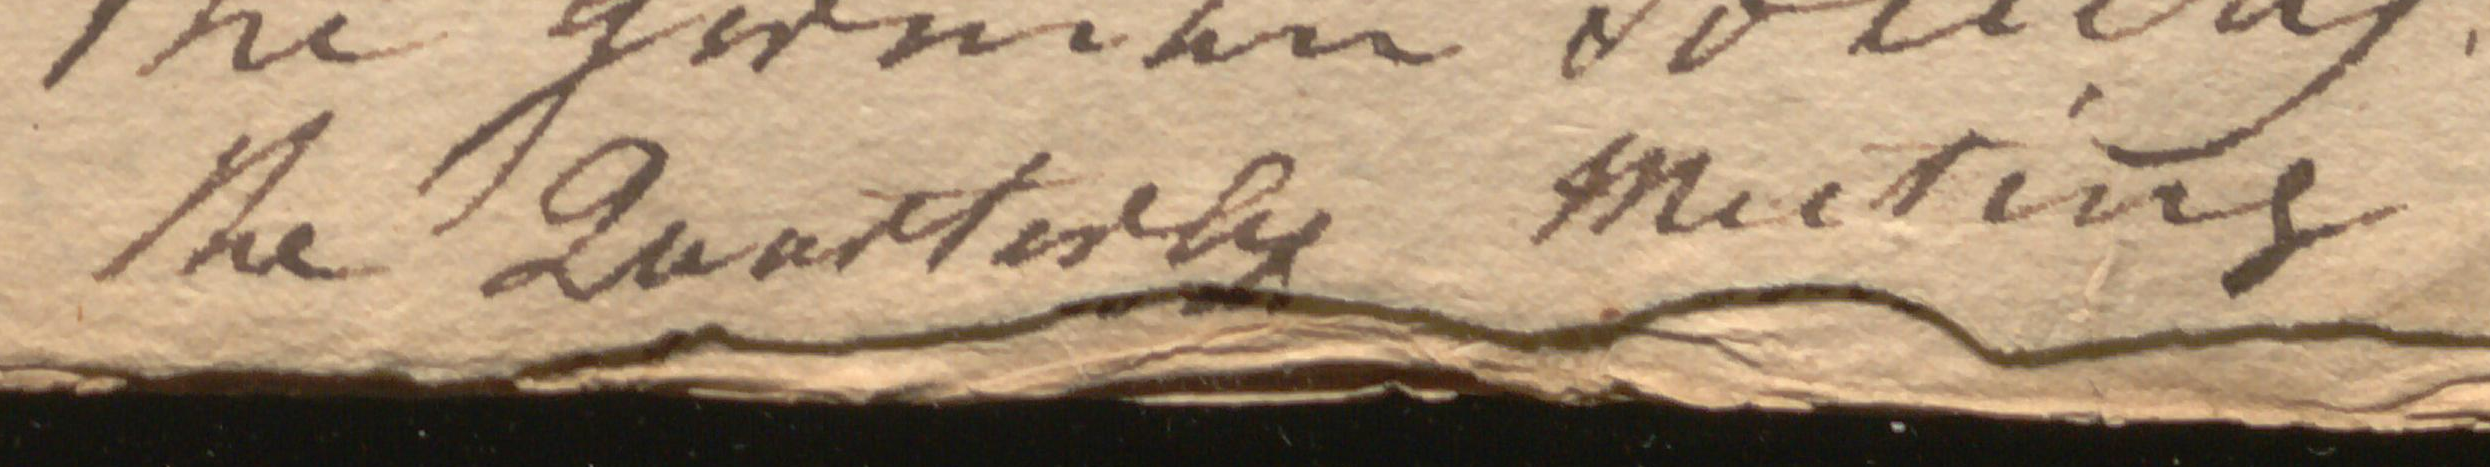the Quarterly meeting
